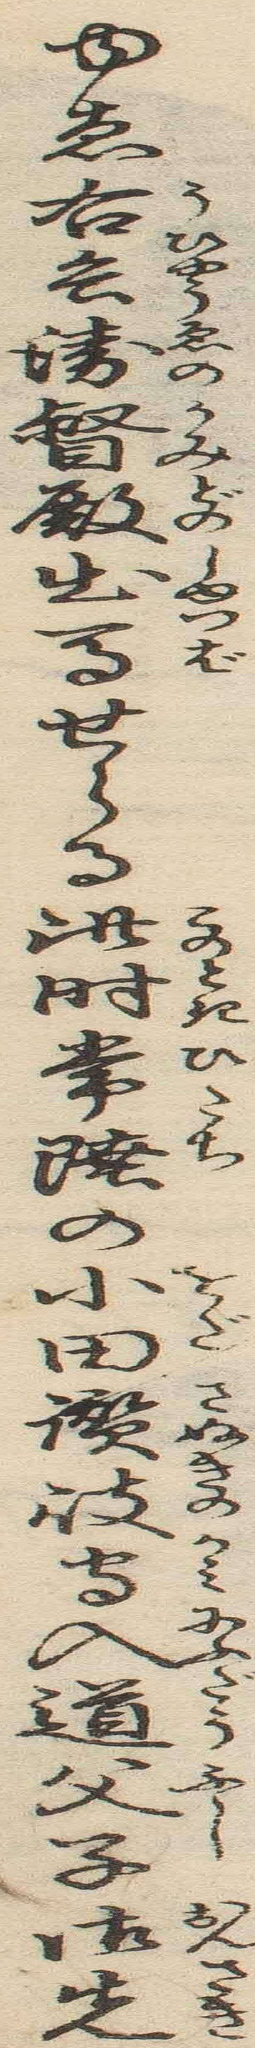ゆゑ右兵衛督殿出馬せらる此时常陸の小田讃岐守入道父子御先

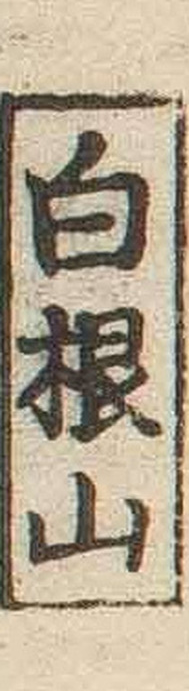白根山

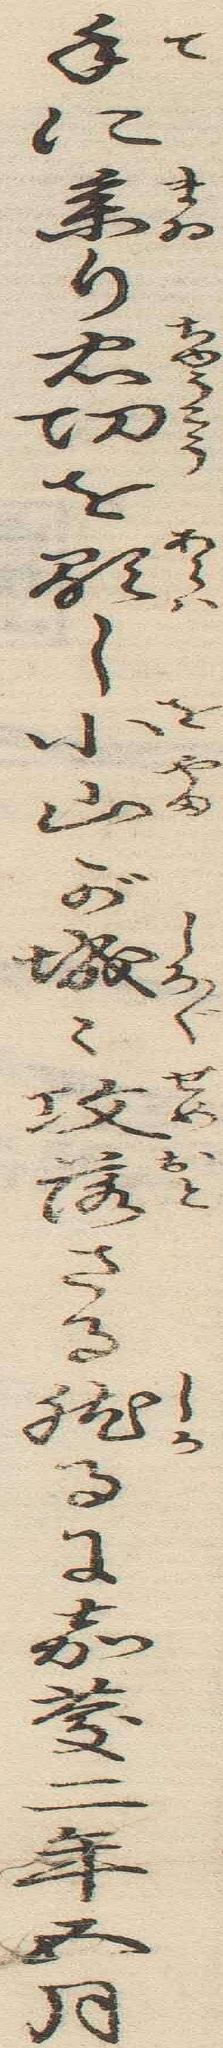手に参り忠功を顕し小山が城〻攻落さる然るに嘉慶二年五月
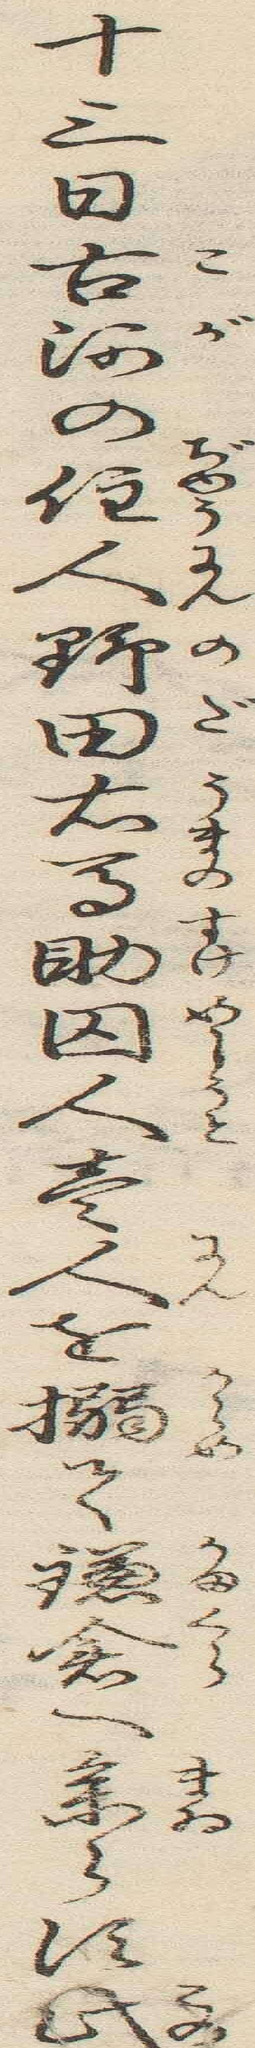十三日古河の住人野田右馬助囚人壱人を搦て鎌倉へ参らす此
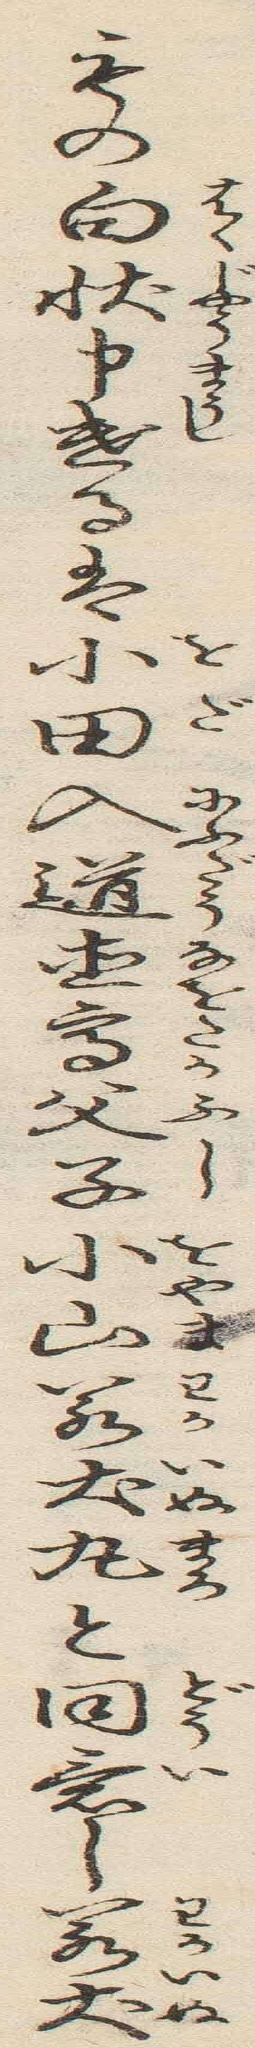もの白状申けるは小田入道直高父子小山若犬丸と同意し若犬
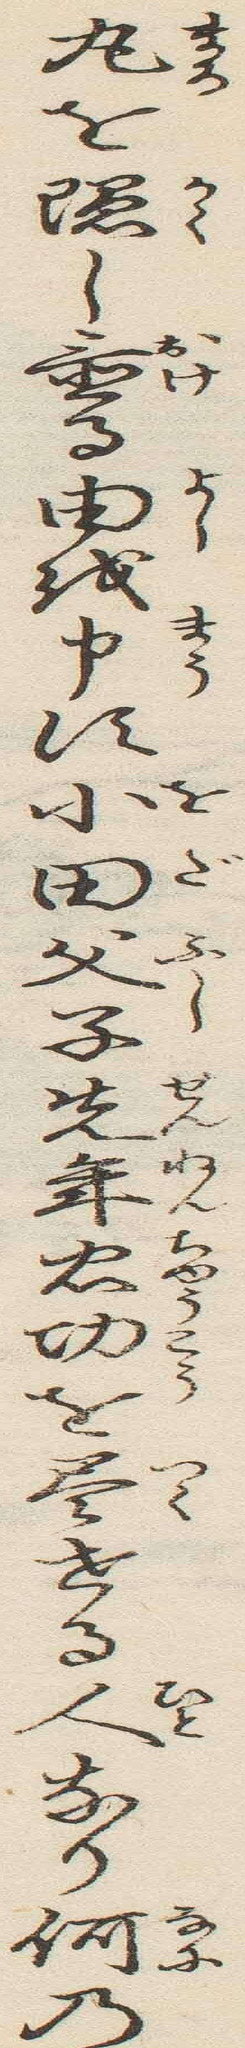丸を隠し置る由を申す小田父子先年忠功を尽せる人なり何の
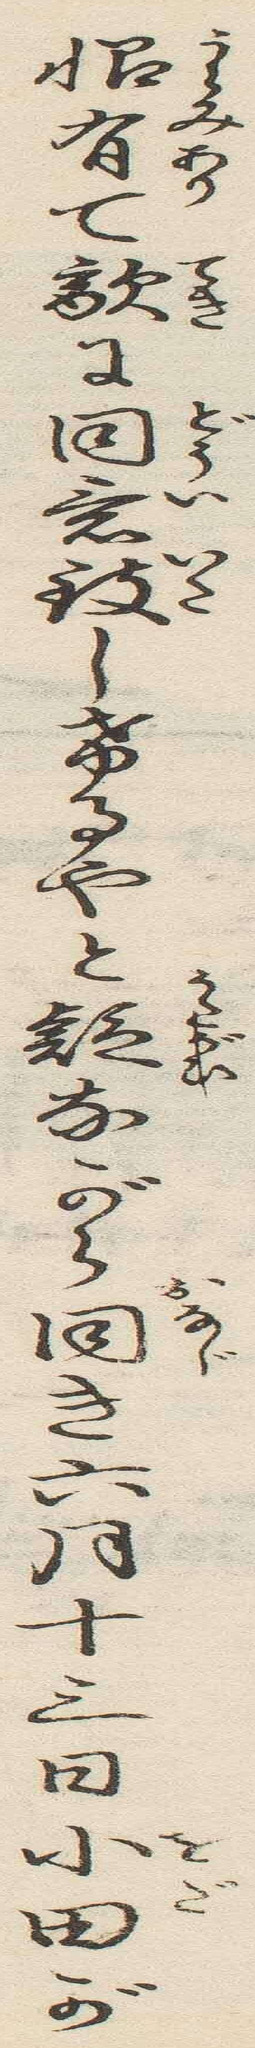恨有て歒に同意致しけるやと疑ながら同き六月十三日小田が
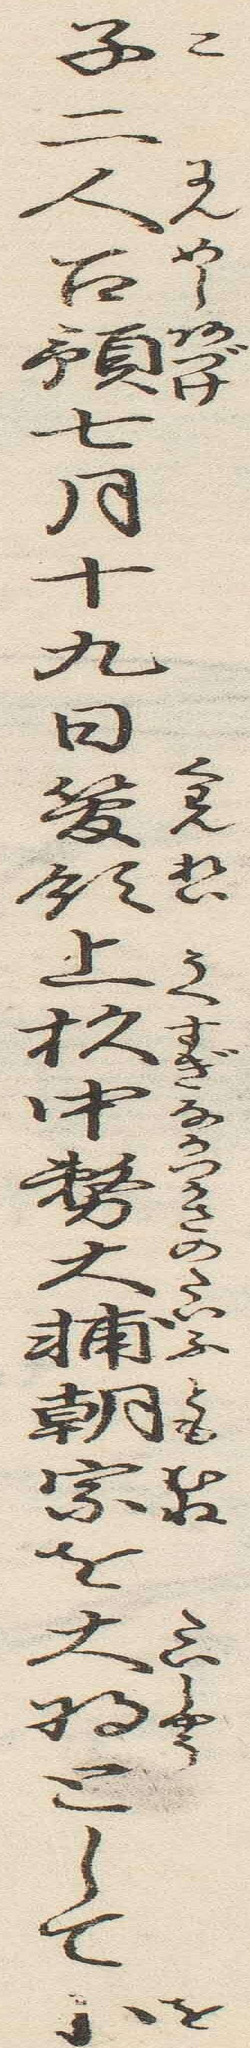子二人召預七月十九日管領上杉中務大輔朝宗を大将として小
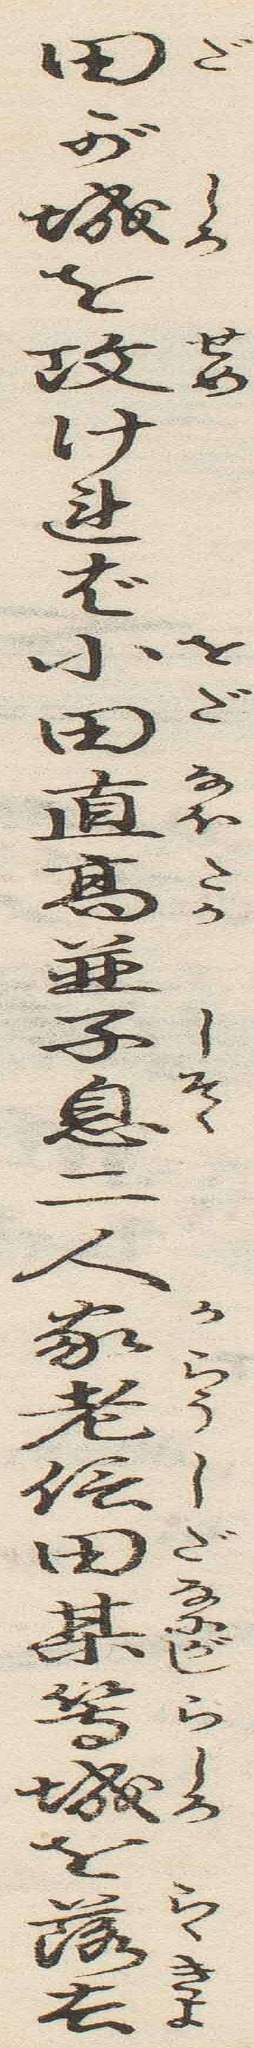田が城を攻ければ小田直高並子息二人家老信田某等城を落去
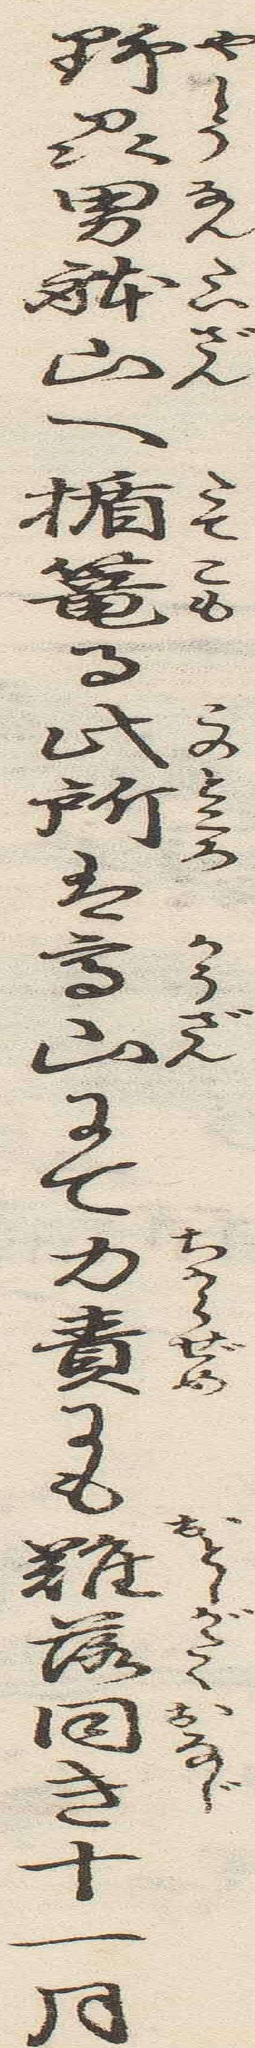野刕男躰山へ楯篭る此所は高山にて力責にも難落同き十一月
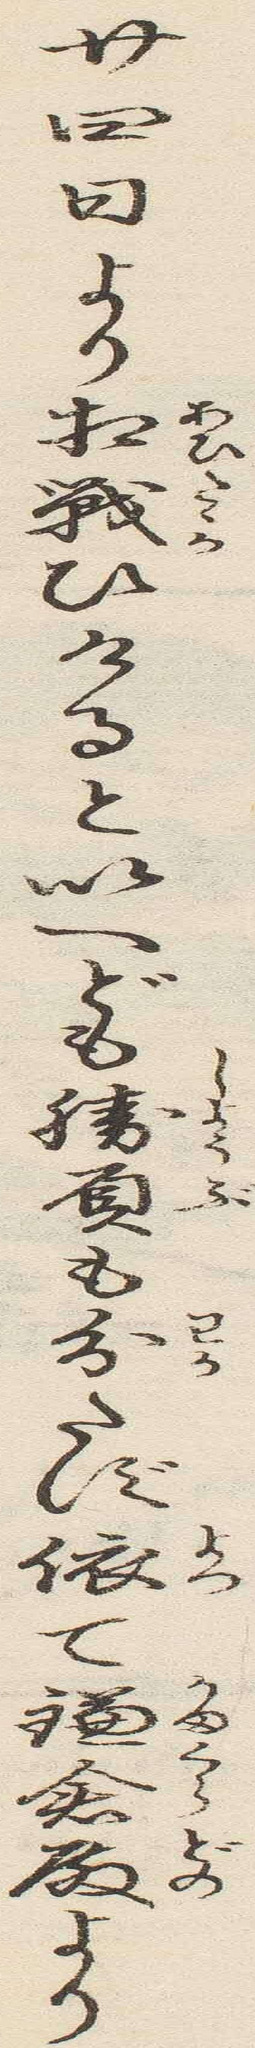廿四日より相戦ひけるといへども勝負も分たず依て鎌倉殿より
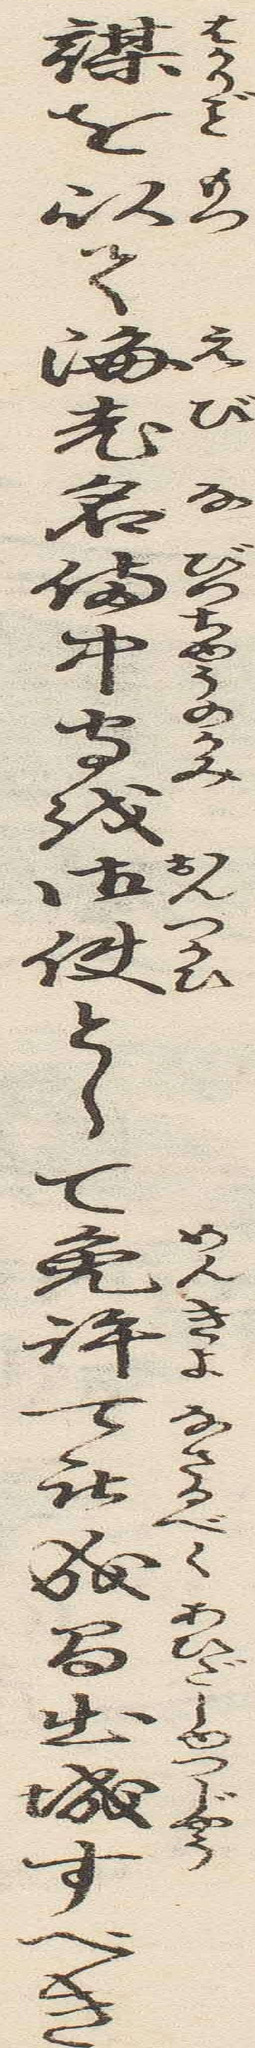謀を以て海老名備中守を御使として免許可被成間出城すべき
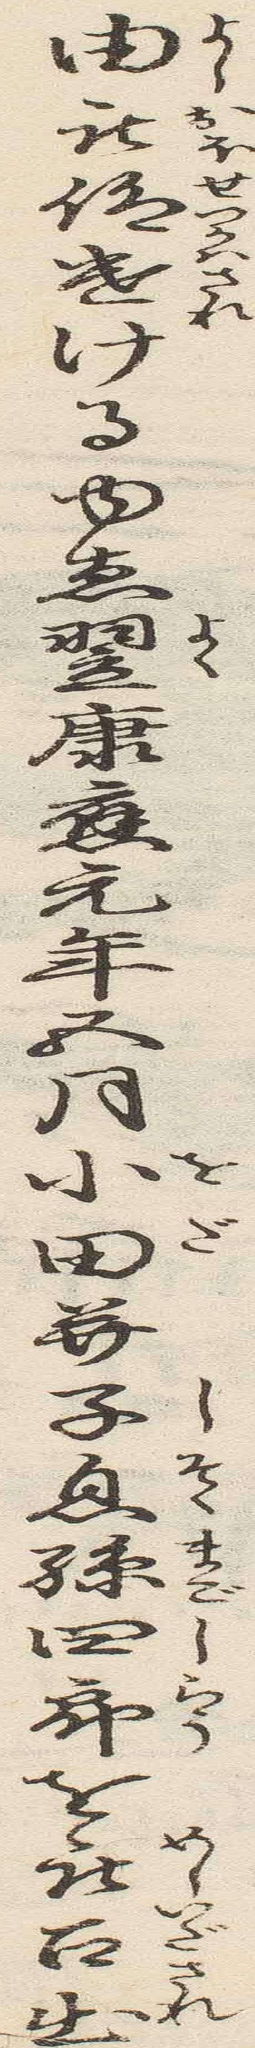由被仰遣けるゆゑ翌康慶元年五月小田并子息孫四郎を被召出
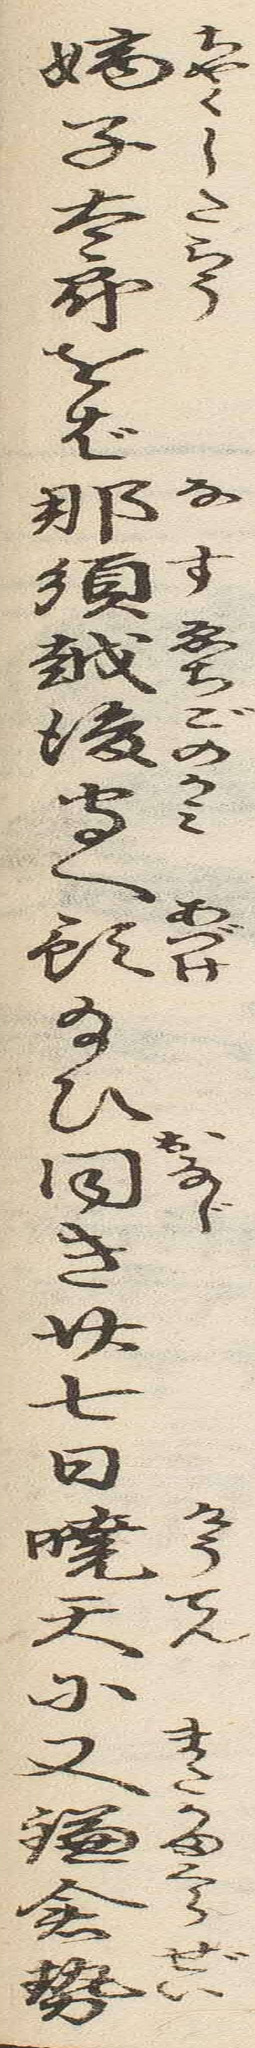嫡子太郎をば那須越後守へ預給ひ同き廿七日曉天に又鎌倉㔟
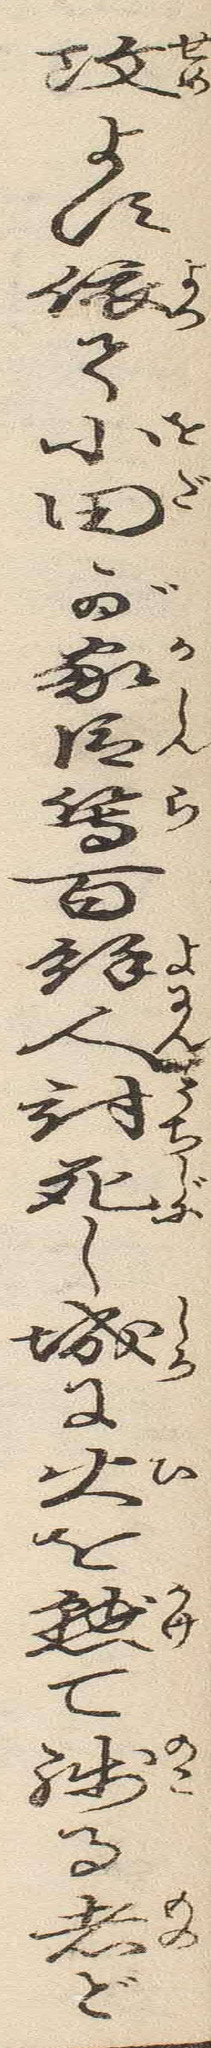攻よす依て小田が家臣等百餘人討死し城に火を懸て残る者ど
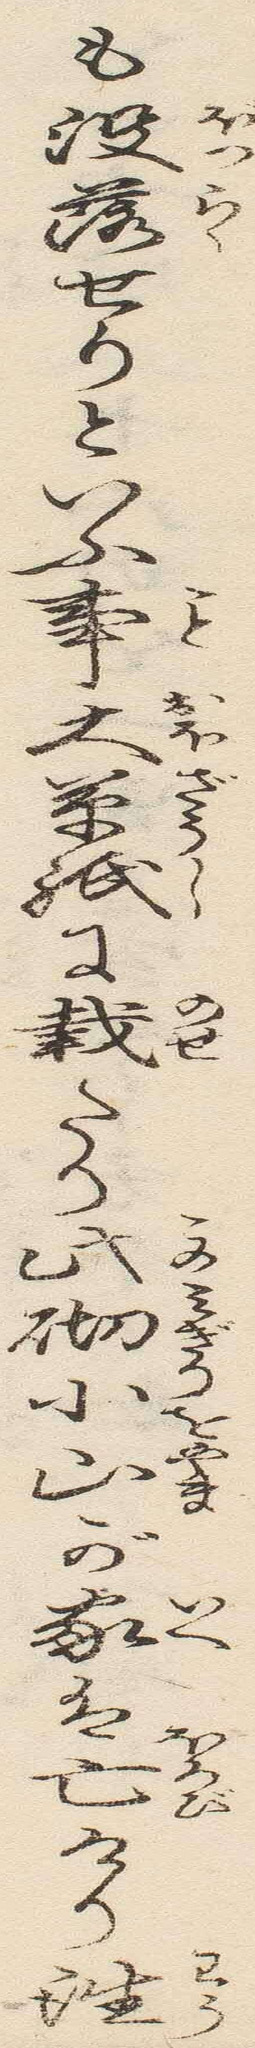も没落せりといふ事大草紙に載たり此砌小山が家は亡けり徃
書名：日光山志
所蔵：東京学芸大学附属図書館 国文学研究資料館
